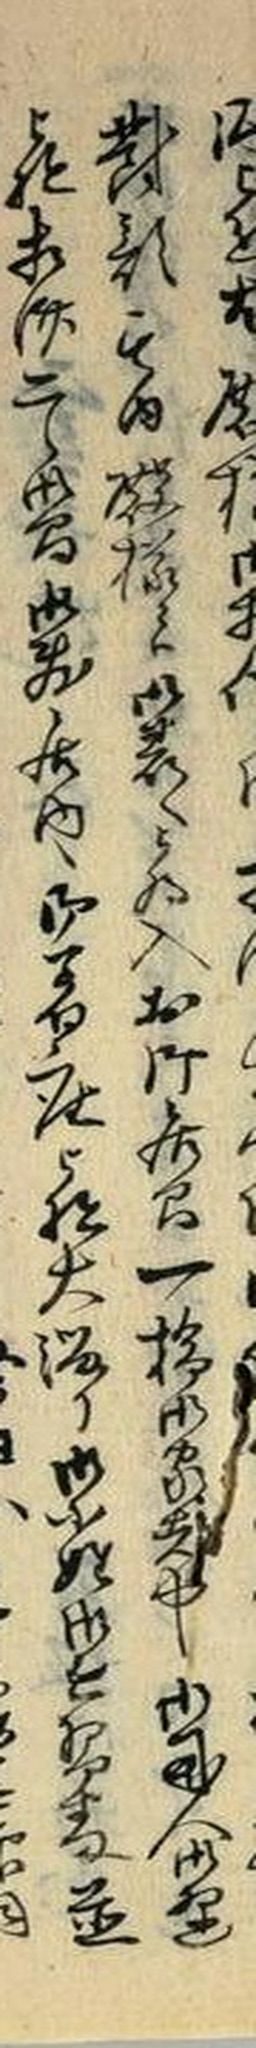被遊相済二之御間御敷居内へ御着座被遊大溜り御小姓御近習番並
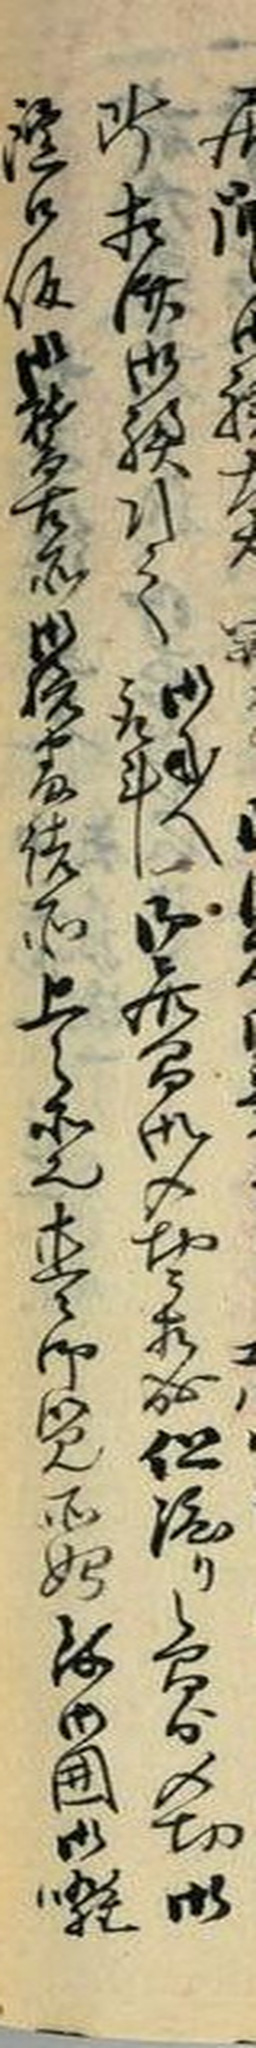錠口仮稽古所御膳番詰所上之所也直ニ御覧所始致御囲御囃
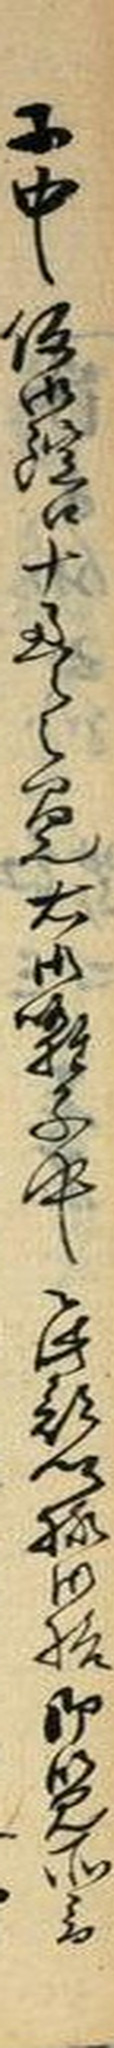子中仮御錠口十畳之間也右御囃子中民部卿様御御膳御覧所ニ而
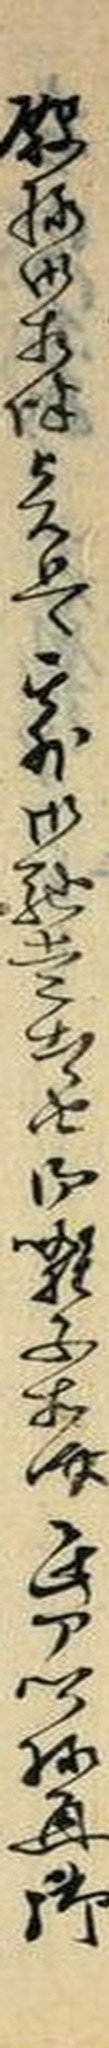殿様御相伴被召上候其外御馳走出候由御囃子相済民部卿様再御
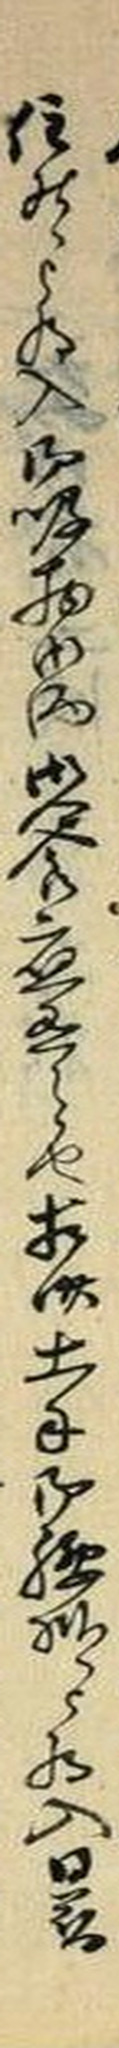住居へ被為入御吸物御酒御饗応有之候由相済土手御腰掛へ被為入日暮
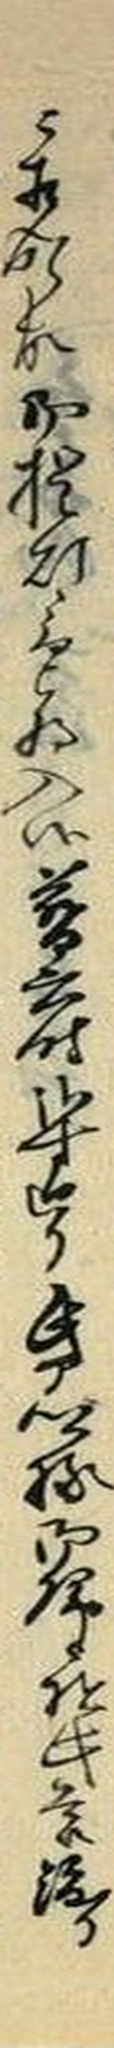ニ相成候故御提灯ニ而被為入候暮六時弐寸廻民部卿様御帰被遊此節溜り
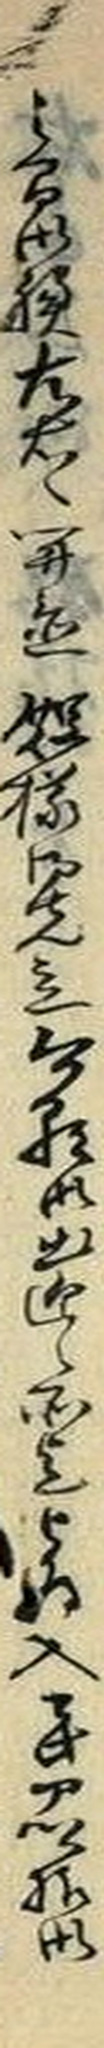之間御襖左右へ開置殿様御先立今朝御出迎候所迄被為入民部卿様御
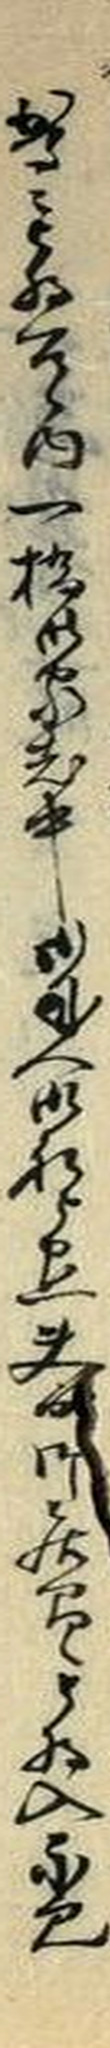駕ニ為召候内一橋御家老中御用人御礼被申上夫ゟ御居間へ被為入永見
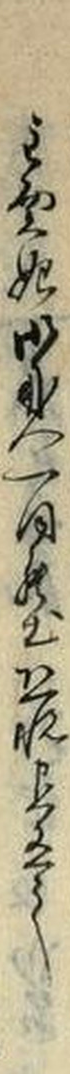主殿始御用人一同罷出恐悦申上有之
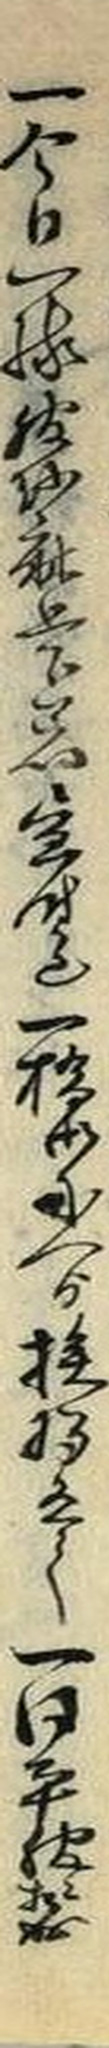一今日一統服紗麻上下着定時迄一橋様御用人ゟ挨拶有之一同平服ニ相成
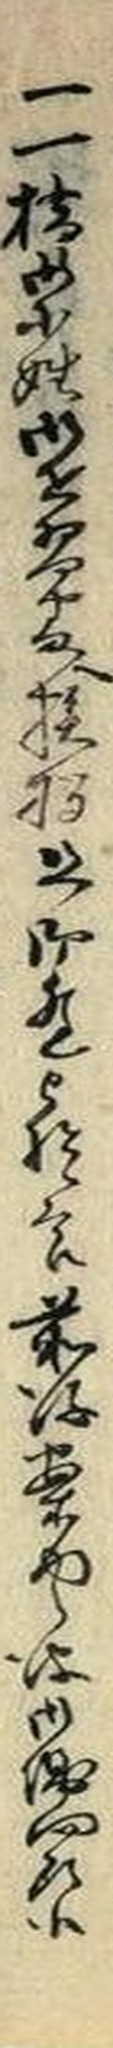一一橋御小姓御近習番へ挨拶且御逢被遊候節前後案内之儀御側向頭取
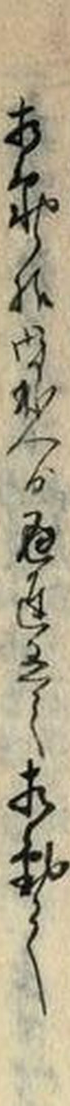相勤候様御用人ゟ通達有之相勤之
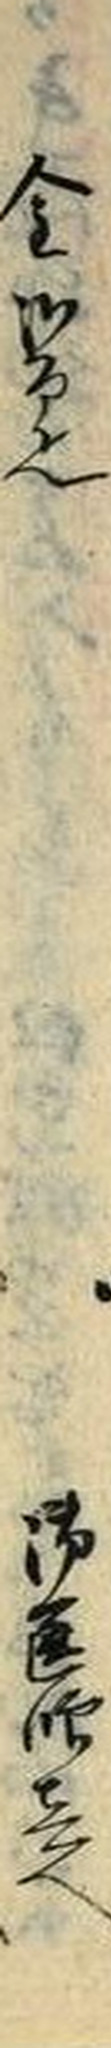金弐百疋同御医師壱人
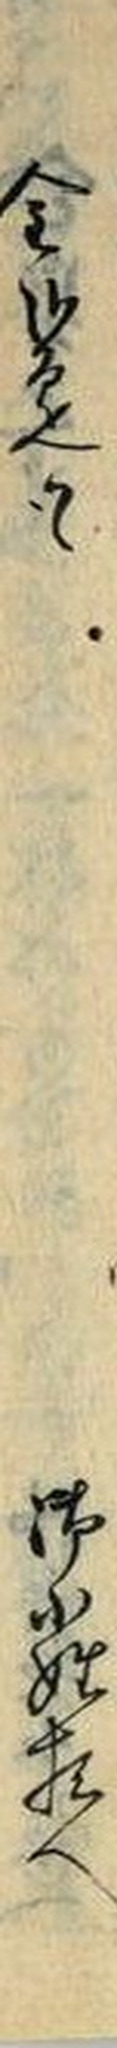金弐百疋ツヽ同御小姓拾人

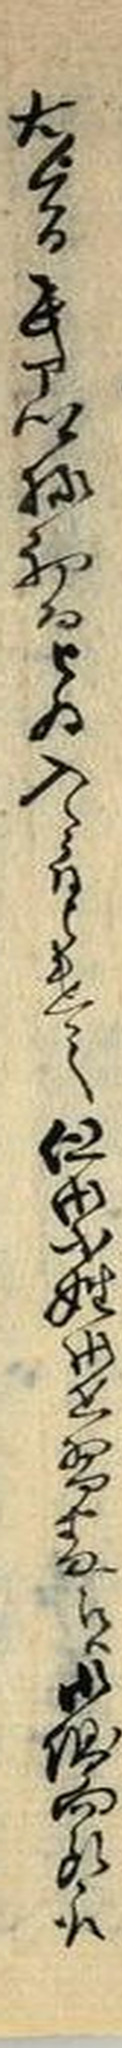右今日民部卿様初而被為入候ニ付被遣之但御小姓御近習番江ハ御側向頭取
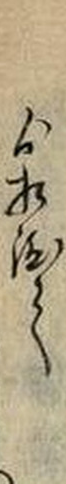ゟ相渡之
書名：少傅日録抄（斉承付側向頭取日記、在府）
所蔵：福井県文書館 Fukui Prefectural Archives
